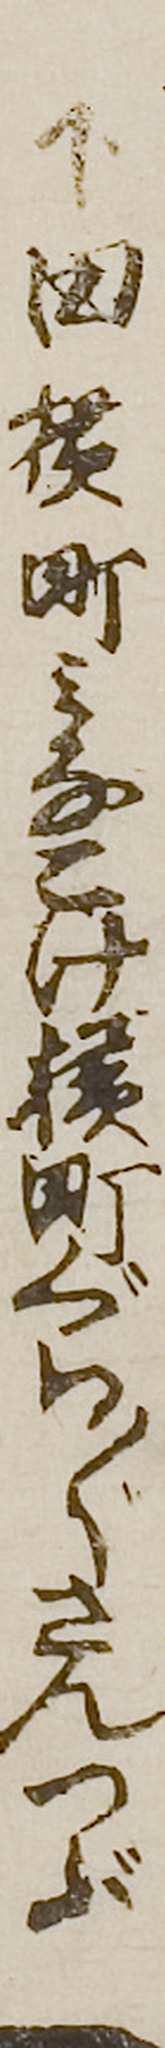下田横町みなこけ横町ぐら〴〵さんつぶ
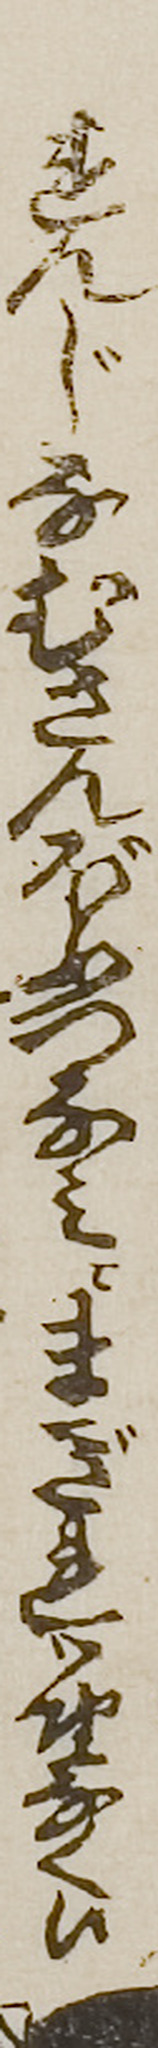れんじなむさんぼふつなみにまぎれ御望なく候
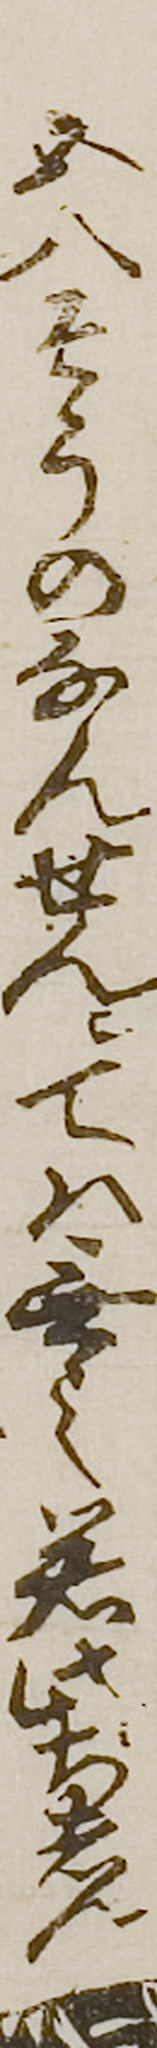五八そうのなんせんにては無之若此ぢしん
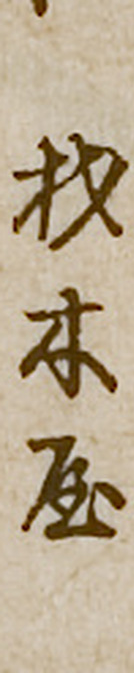材木屋
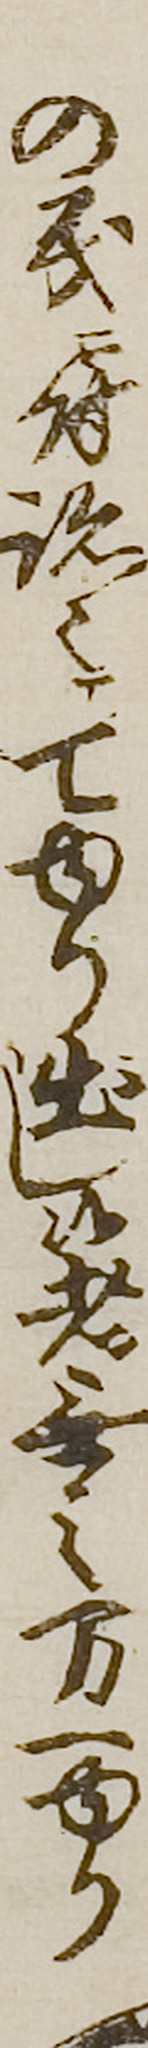の義に付諸々にてゆり出し候者無之万一ゆり
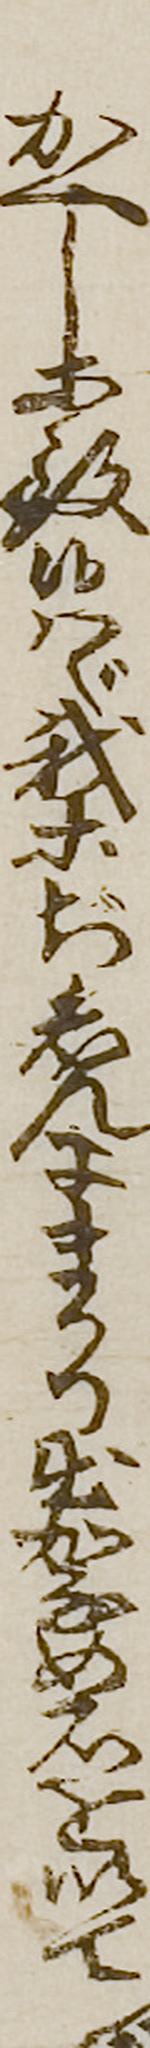かへし等致候はゞ我等ぢしんにまかり出かなめ石を以て
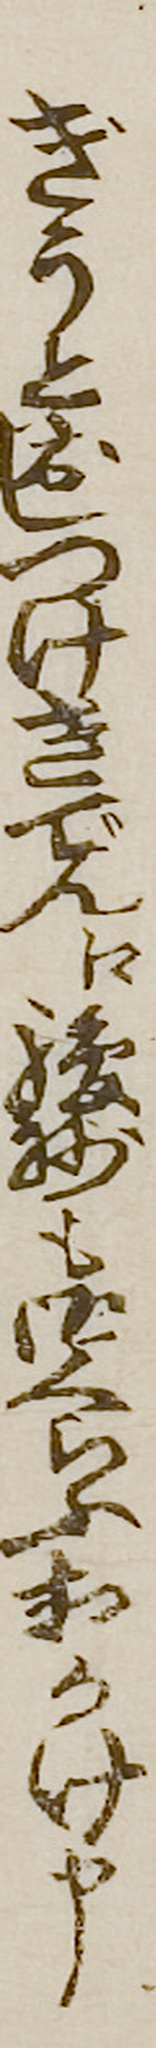ぎうとおしつけきでん江駿河も御くらふ相かけ申
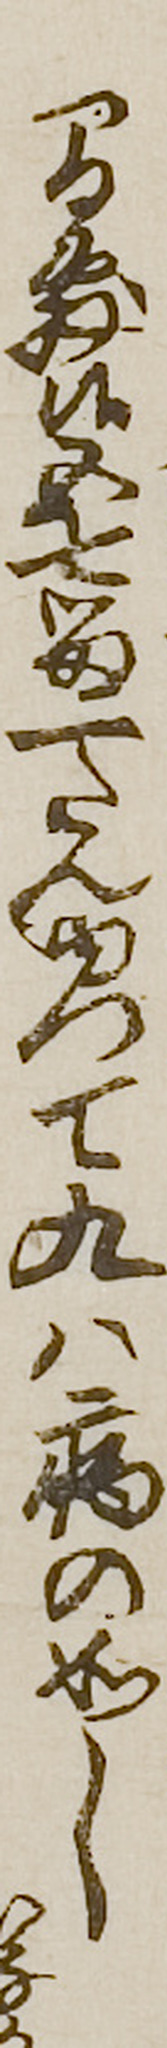間敷候五七留一たんゆつて九は病の如し
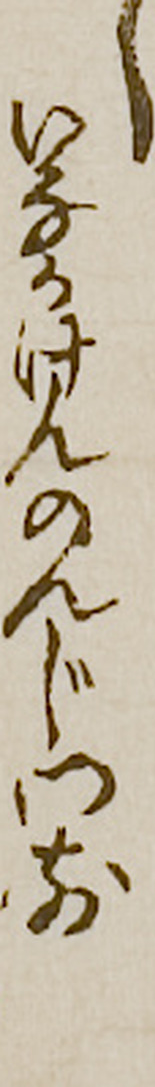いなかけんのんじ門前
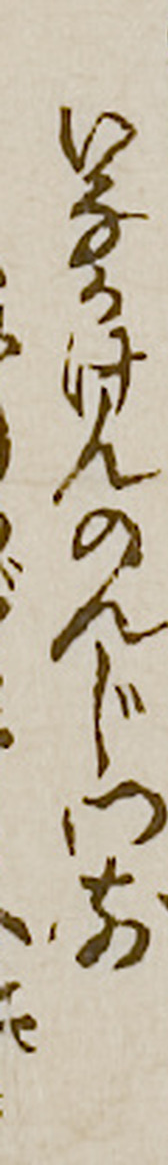いなかけんのんじ門前
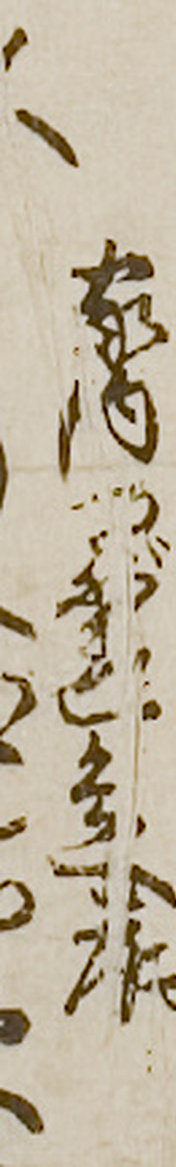家内つぶれ候へ店
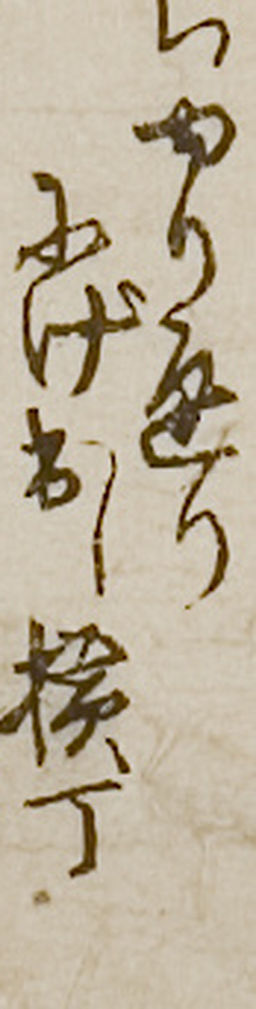にげだし横丁
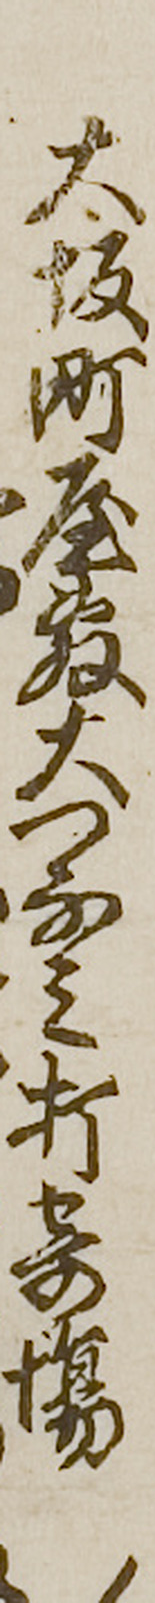大坂町屋敷大つなみ打寄場
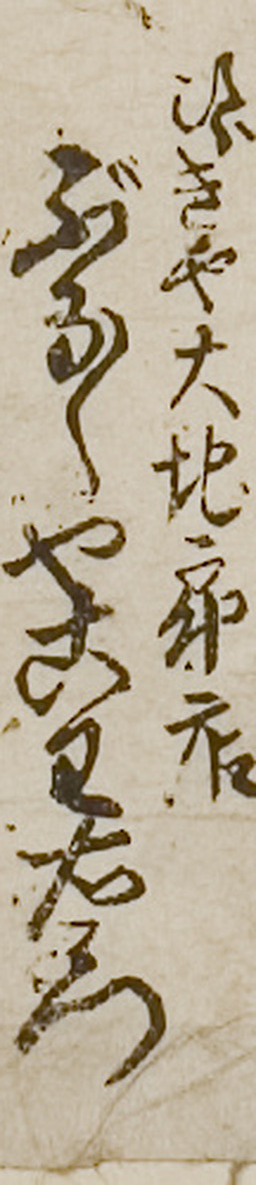ぶなくやこわ右衛門
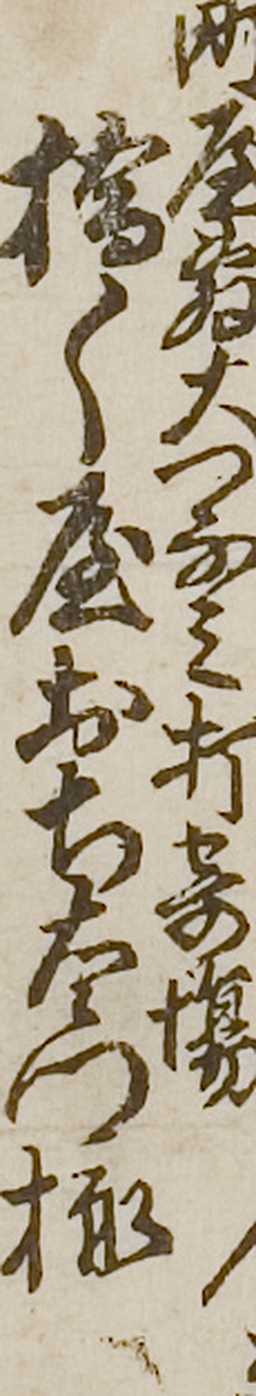橋〳〵屋おち右衛門様
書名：大地震大津浪忠臣蔵九段目秡文句
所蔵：東京大学総合図書館 General Library in the University of Tokyo, JAPAN
